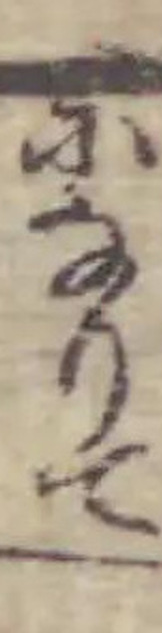になりて
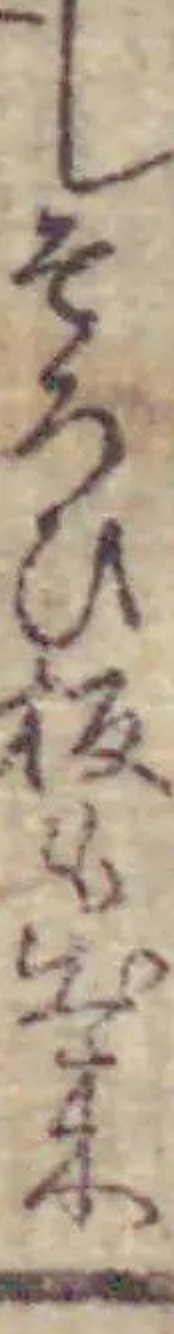そろひ板も出来
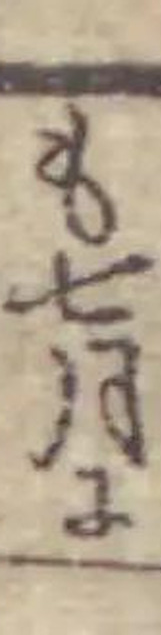も七月に
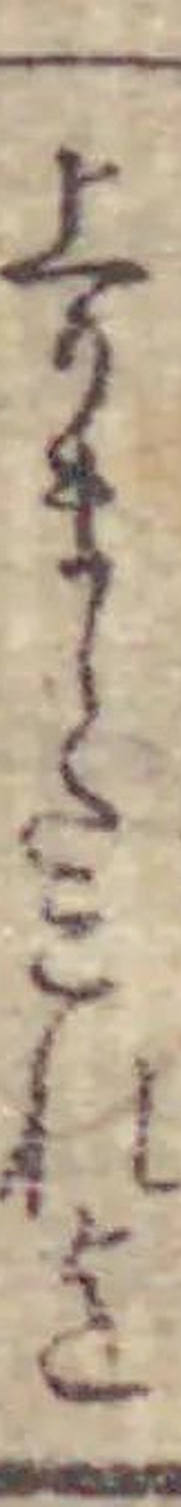上りましたこれ迄
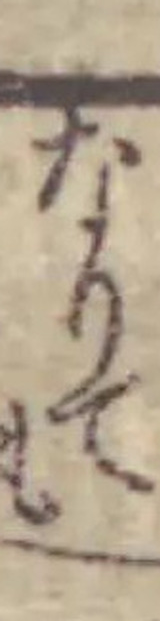なりても
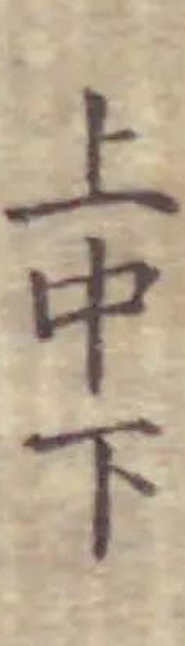上中下
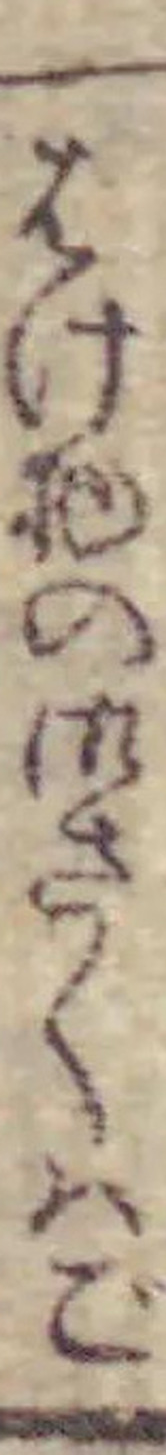はけ物の御さくはご
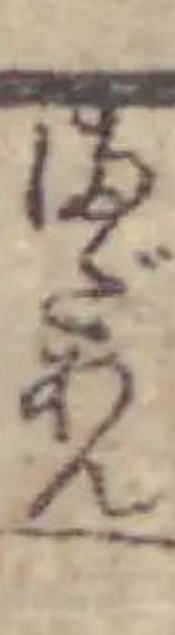まだあん
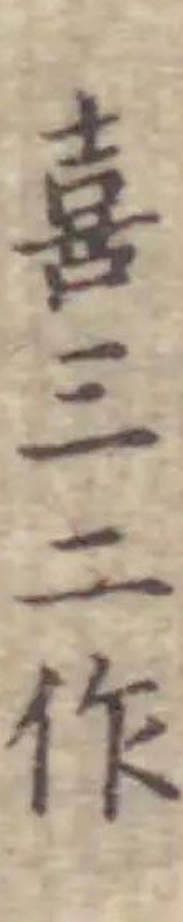喜三二作
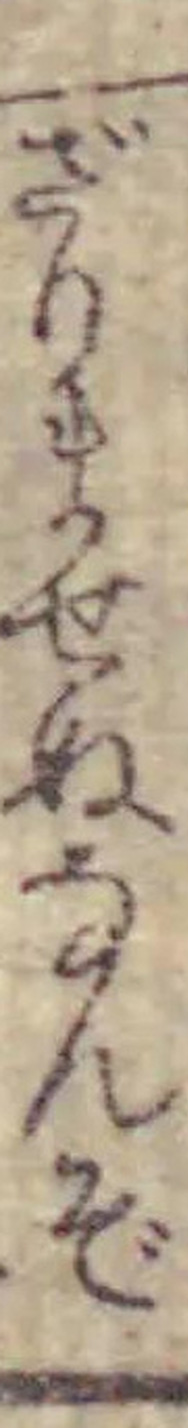ざりませぬなんぞ
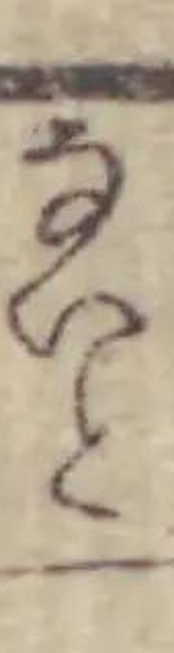ないと
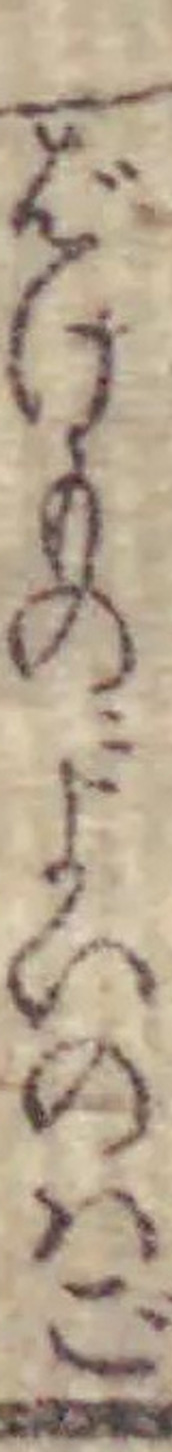ばけものによいのはご
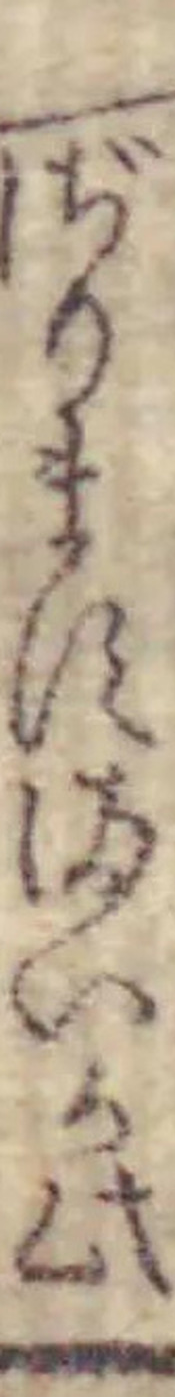ざりますまいか此
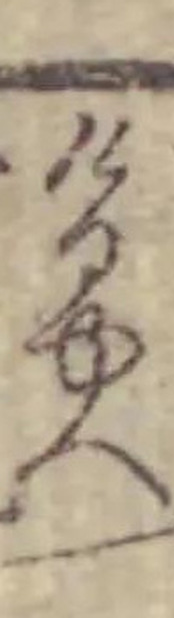けるゆへ
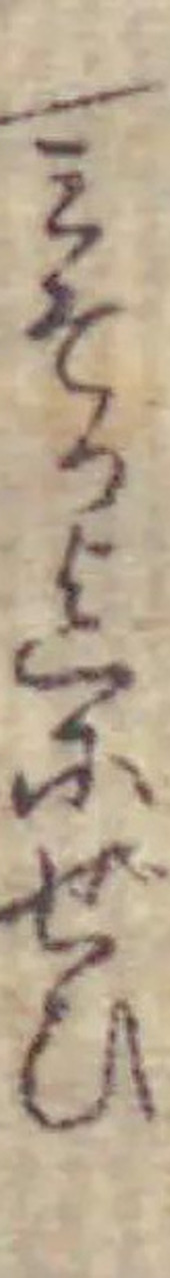みそか迄にぜひ
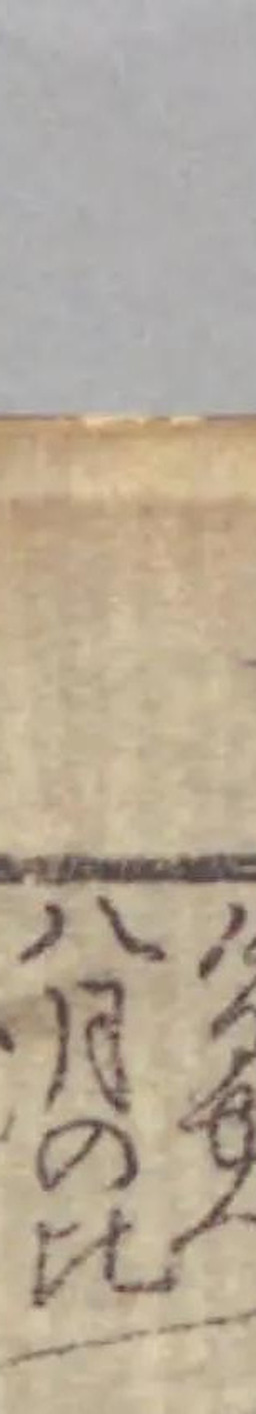八月の頃
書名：亀山人家妖 3巻
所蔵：国立国会図書館 National Diet Library, JAPAN
